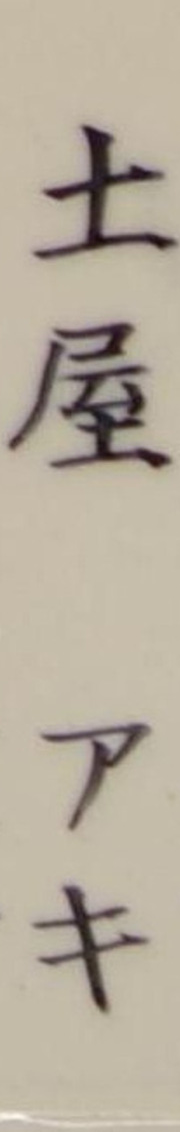土屋アキ
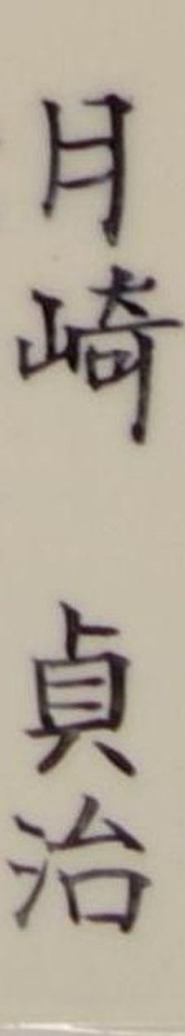月崎貞治
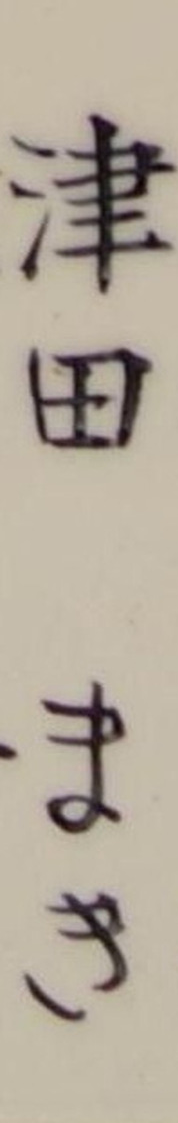津田まき
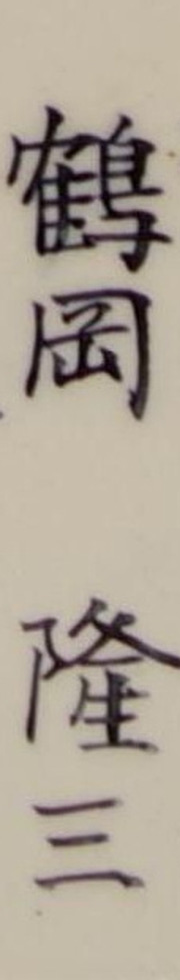鶴岡隆三
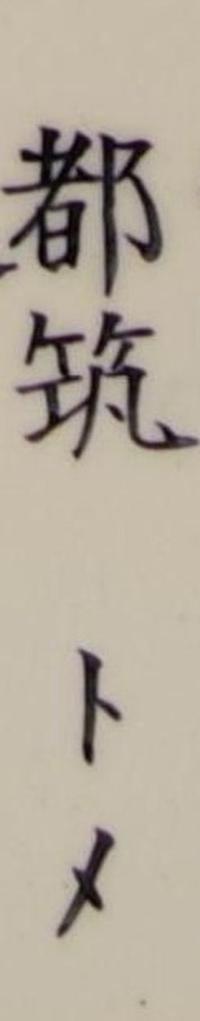都筑トメ
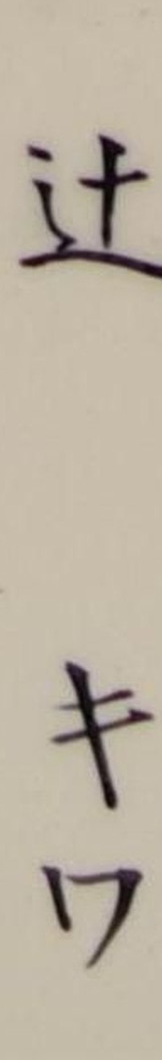辻キワ
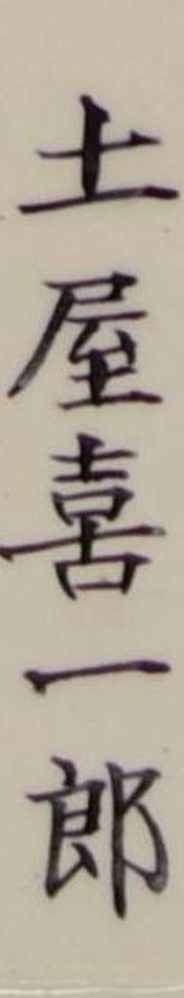土屋喜一郎
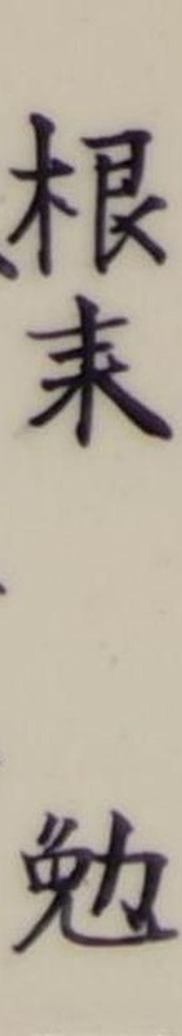根耒勉
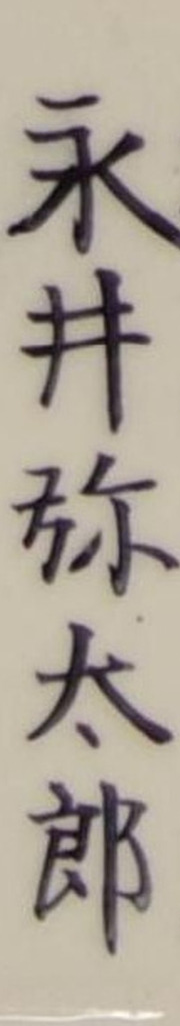永井弥太郎
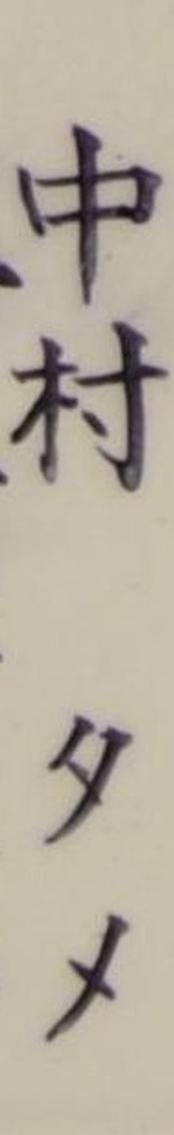中村タメ
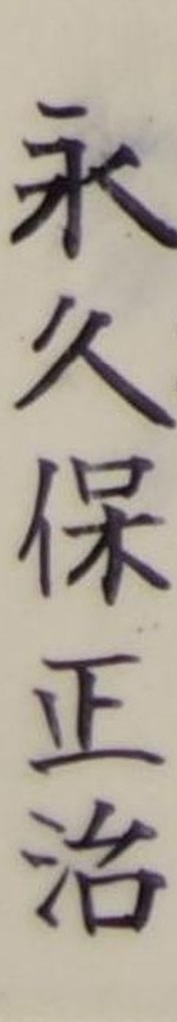永久保正治
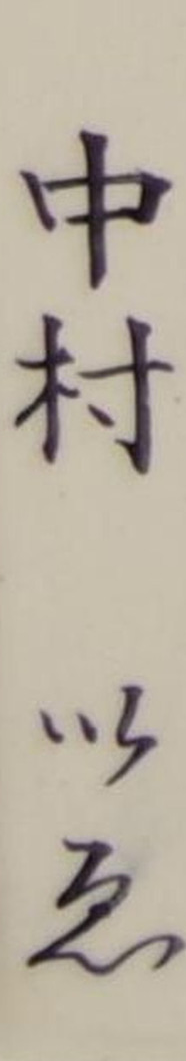中村いえ

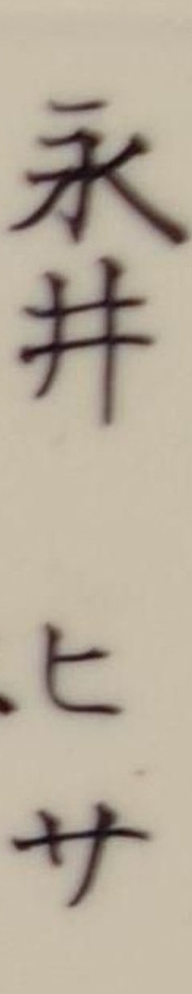永井ヒサ
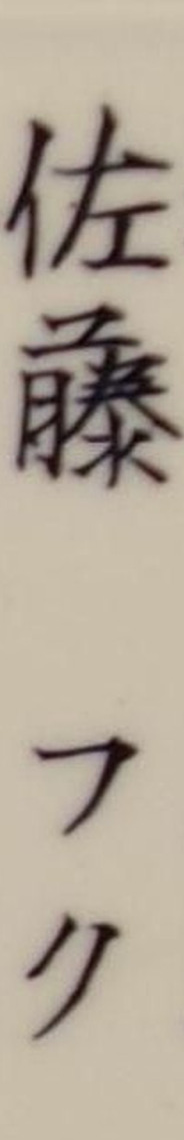佐藤フク
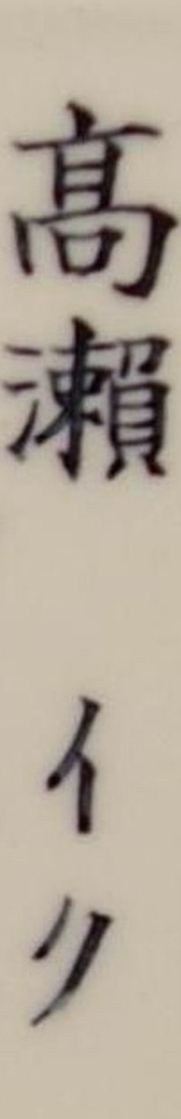高瀨イク
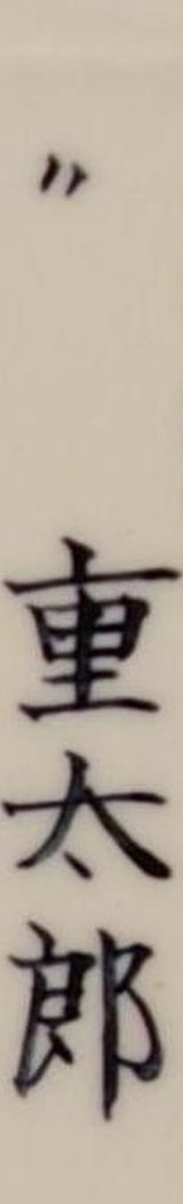重太郎
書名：M~S
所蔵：高野山金剛峯寺
